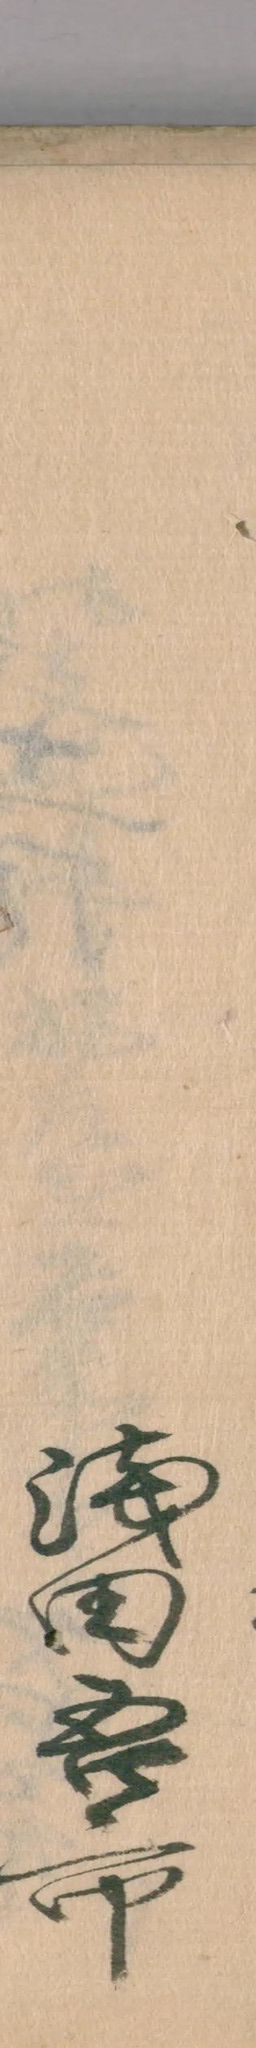浅田吾市
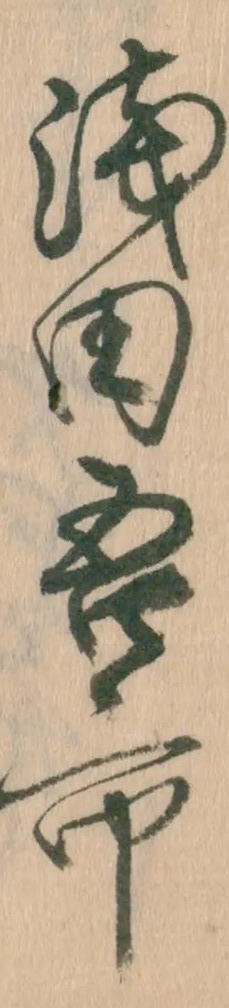浅田吾市
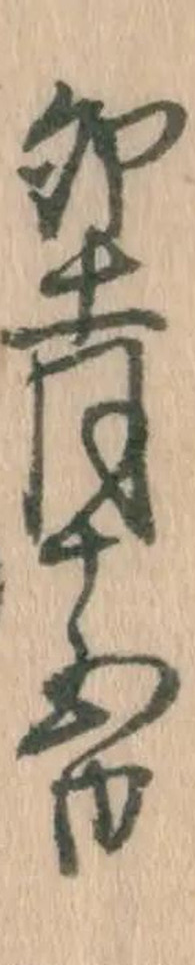卯十一月十五日

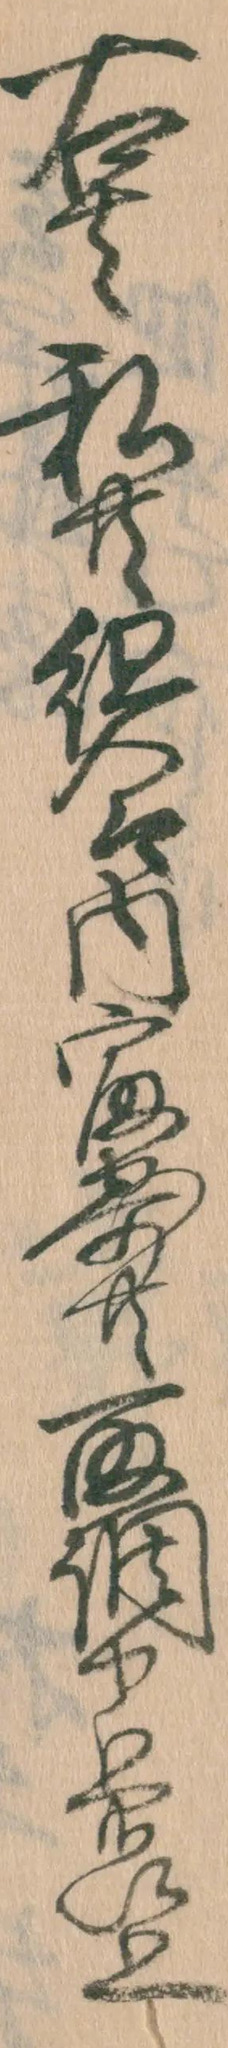右は私共組合内最寄共取調申上候以上
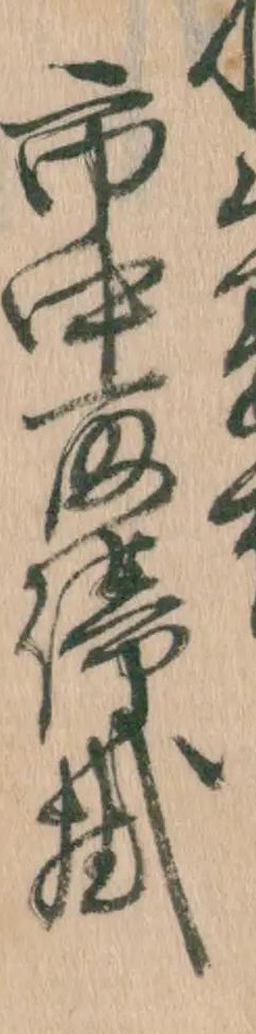市中取締掛
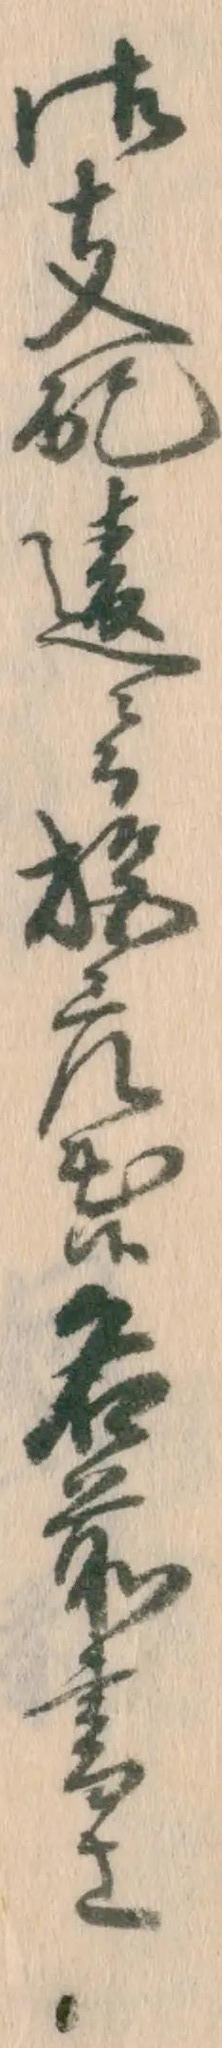御支配違ニ而施差出候名前書上
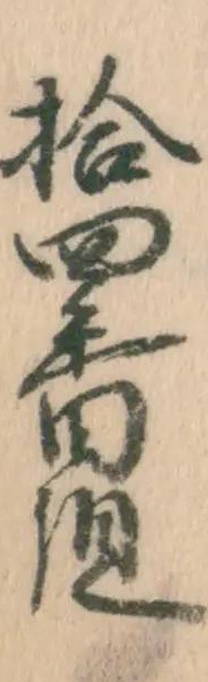拾四番組

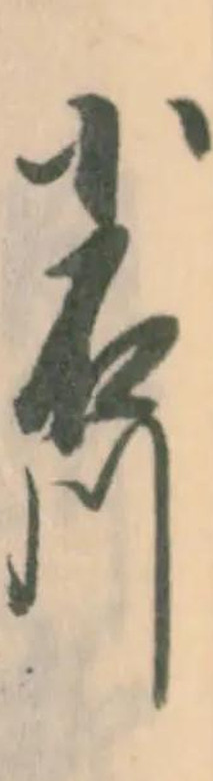小石川
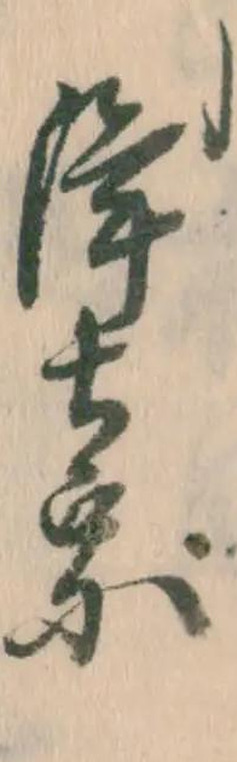浄土宗
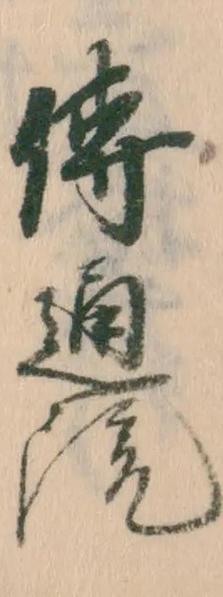伝通院
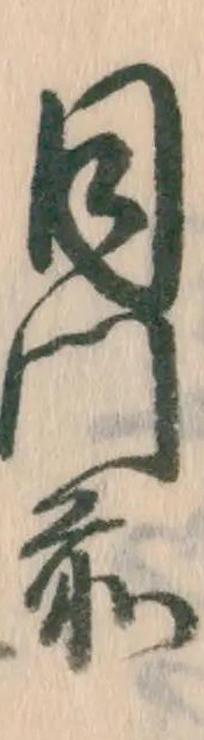同門前
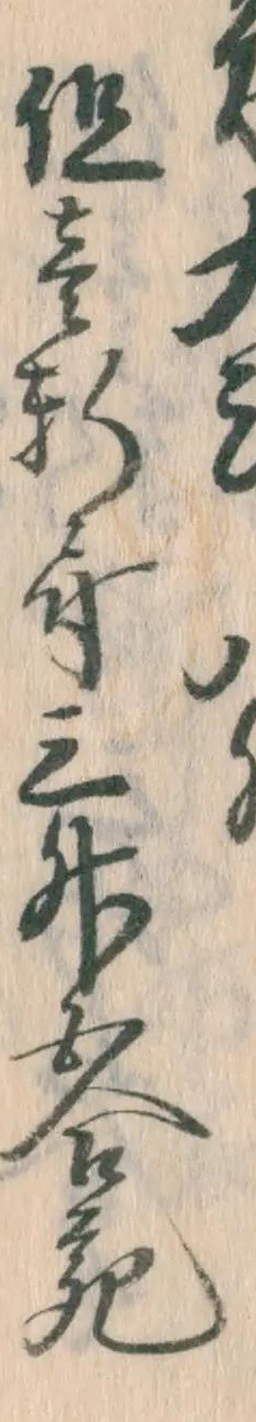但壱軒ニ付三升五合宛

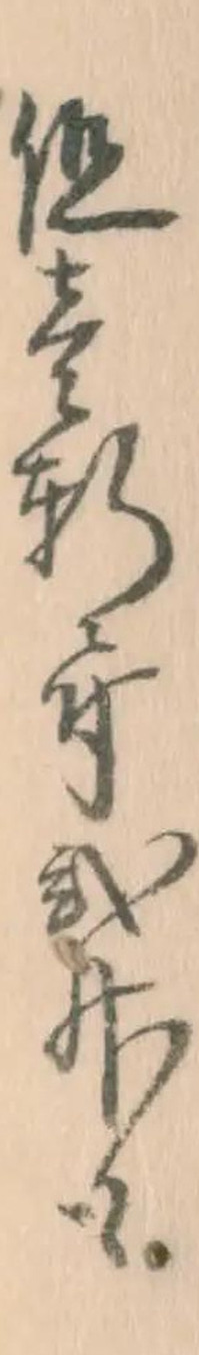但壱人ニ付七升ツヽ
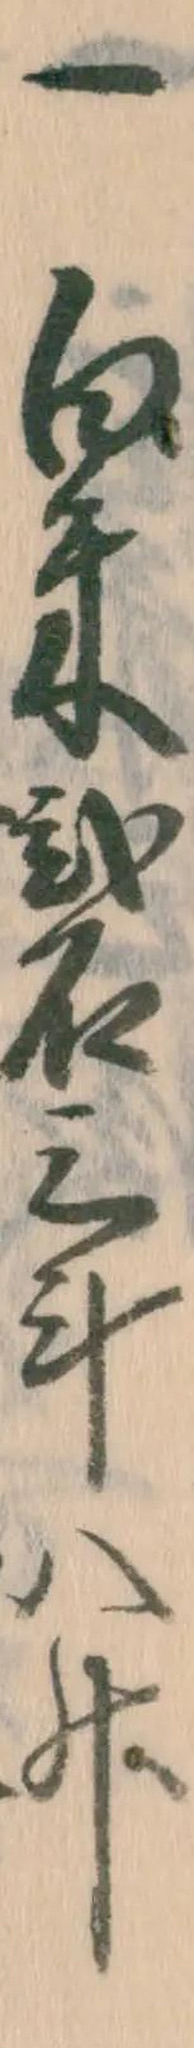一白米弐石三斗八升同
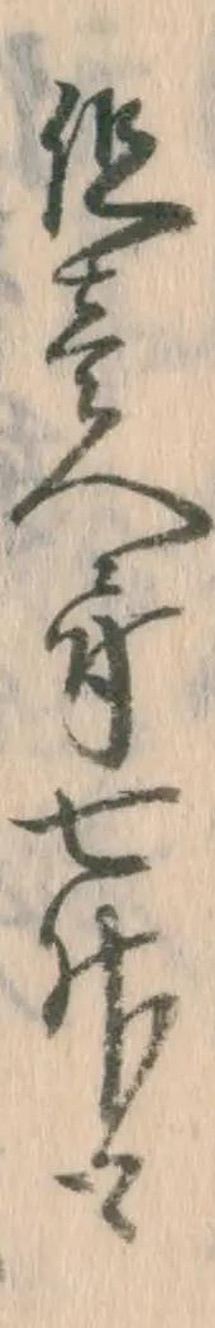但壱人ニ付七升ツヽ
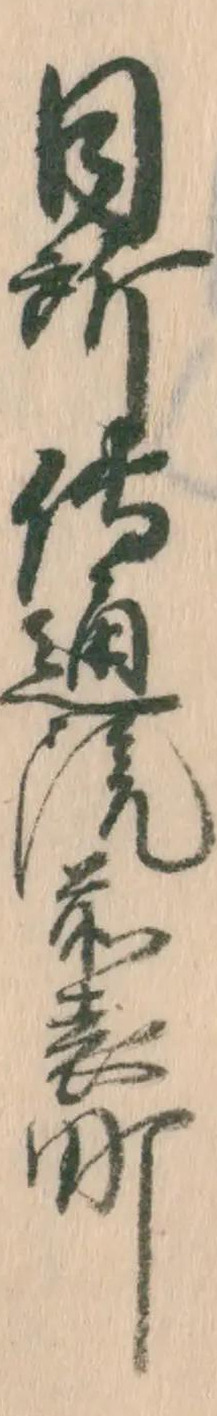同同町伝通院前表町
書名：武家方并寺院等ニテ施差出候一件
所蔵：国立国会図書館 National Diet Library, JAPAN
